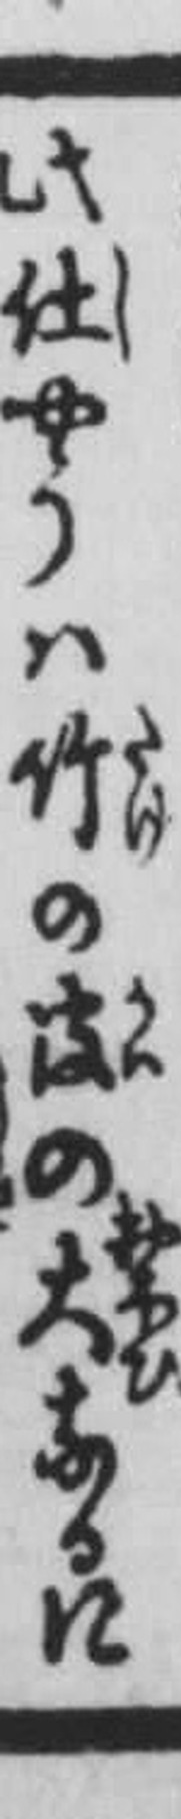此仕やうは竹の皮の大なるに
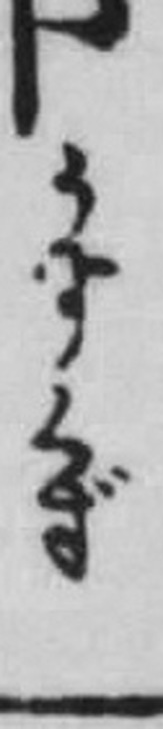うすくず
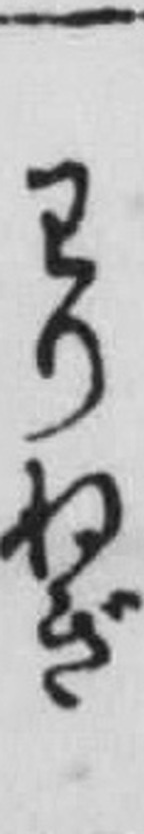わりねぎ
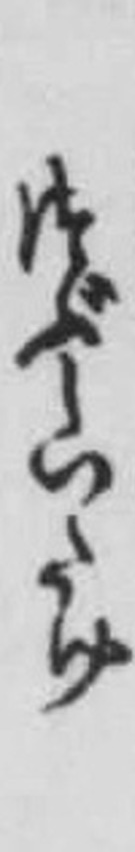つぶしいたけ
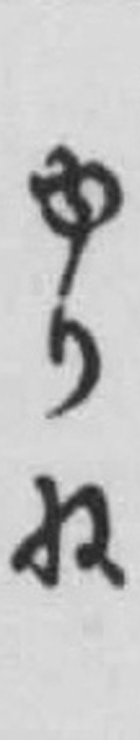ゆりね
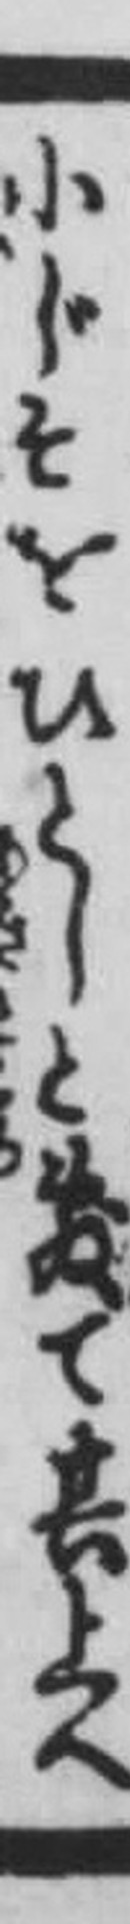小じそをひとしと敷て其上へ
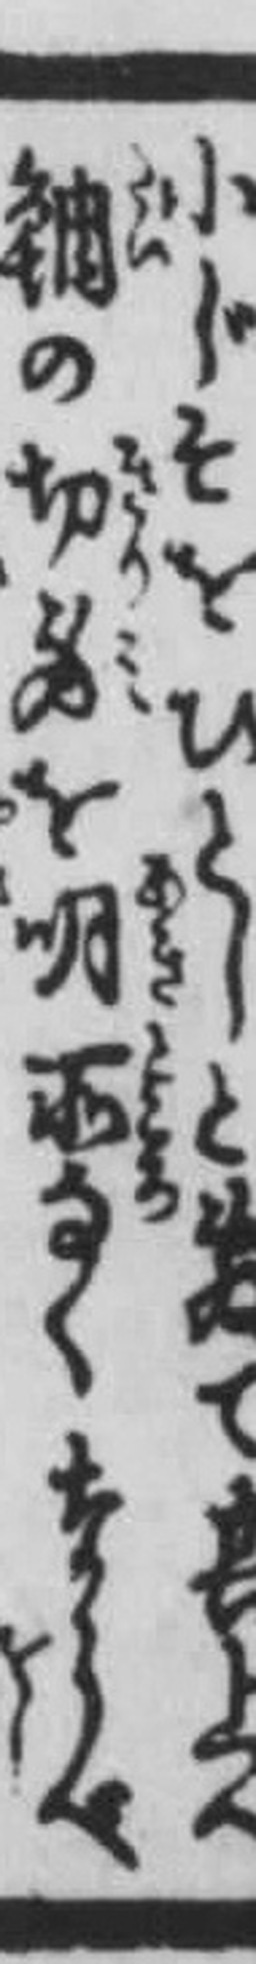鯛の切身を明所なくならべ
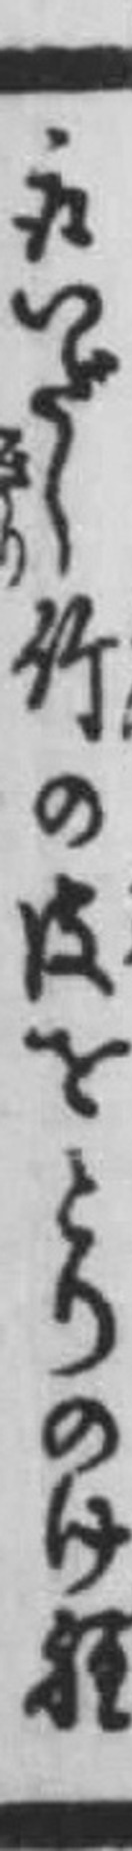取いだし竹の皮をとりのけ程
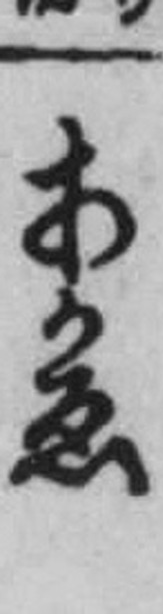あかゑ
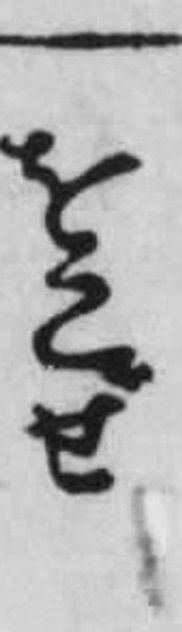をこぜ
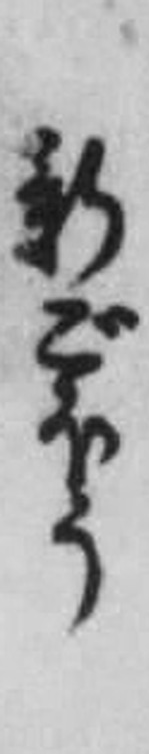新ごほう
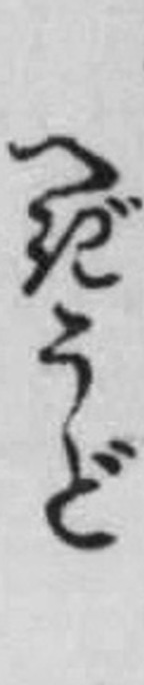へぎうど
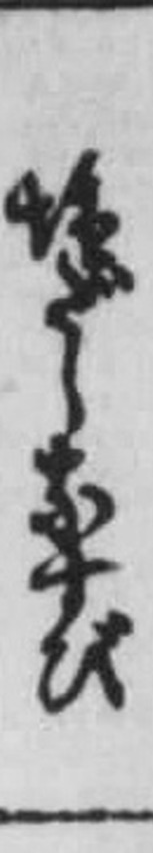塩たしなすび
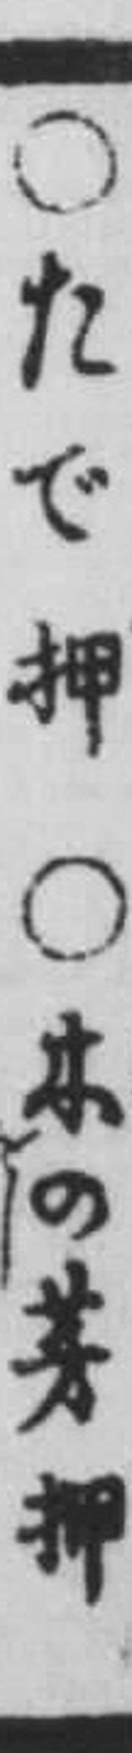〇たで押〇木の芽押
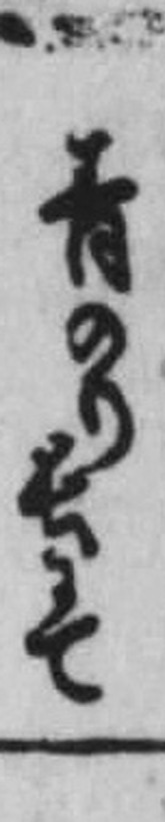青のり長にて
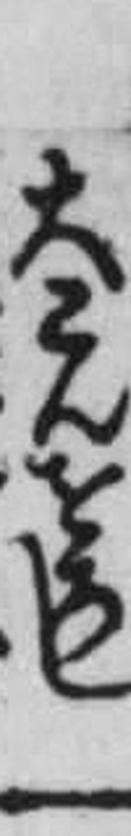大こんをろし
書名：日用重宝魚類精進/料理早工風
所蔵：大阪府立大学学術情報センター 国文学研究資料館
